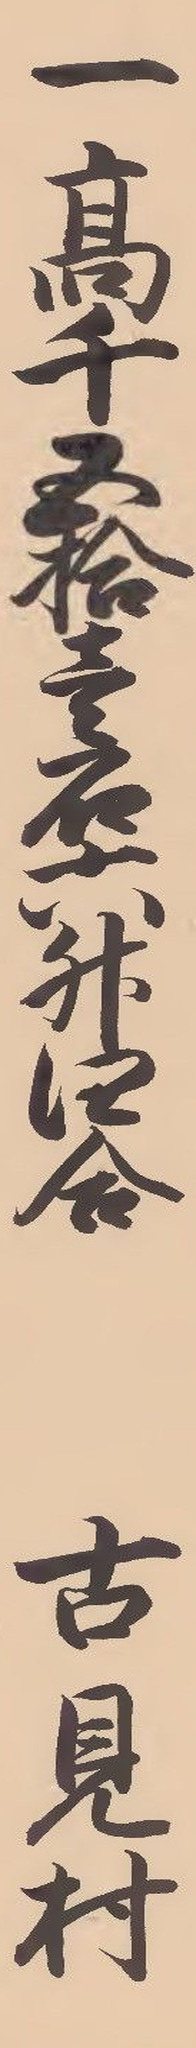一高千五拾壱石六升四合古見村
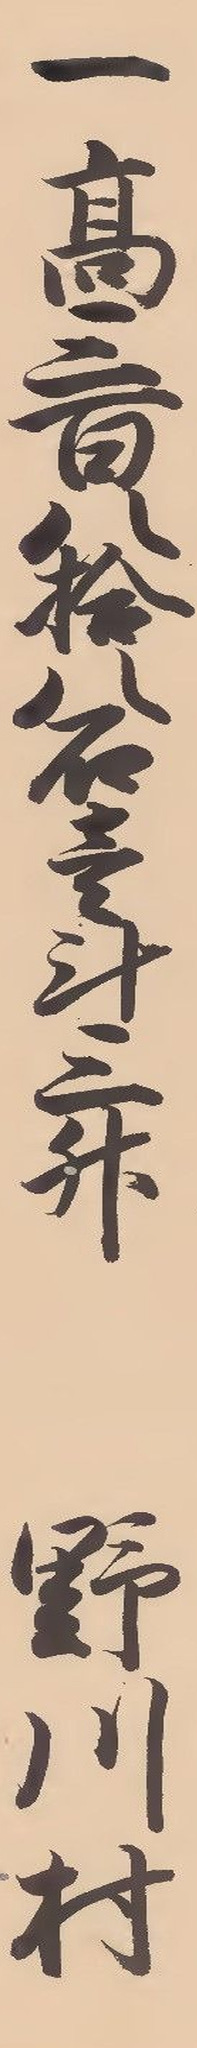一高三百八拾八石壱斗三升野川村

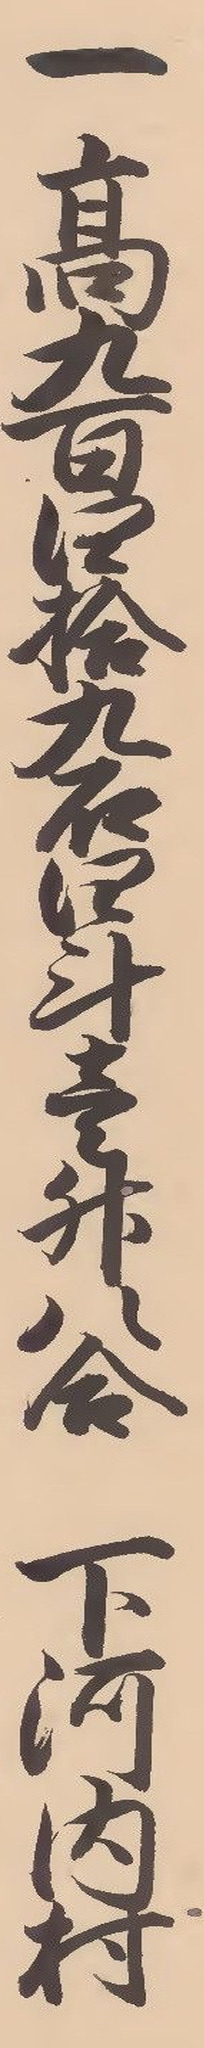一高九百四拾九石四斗壱升八合下河内村
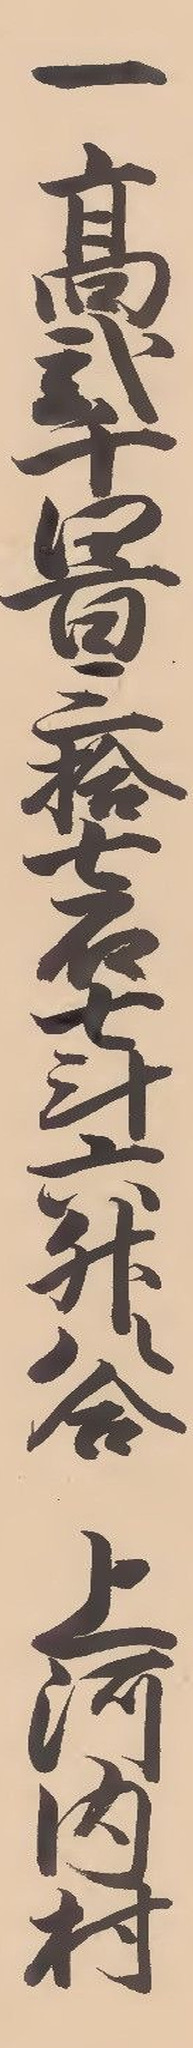一高弐千四百三拾七石七斗六升八合上河内村
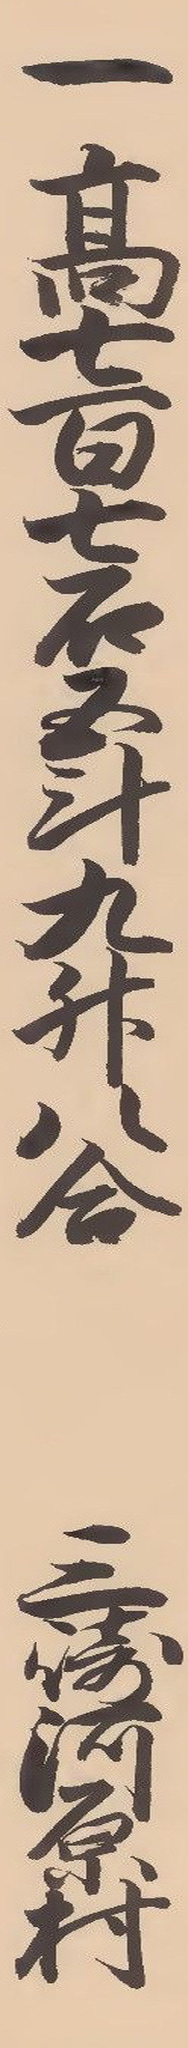一高七百七石五斗九升八合三崎河原村
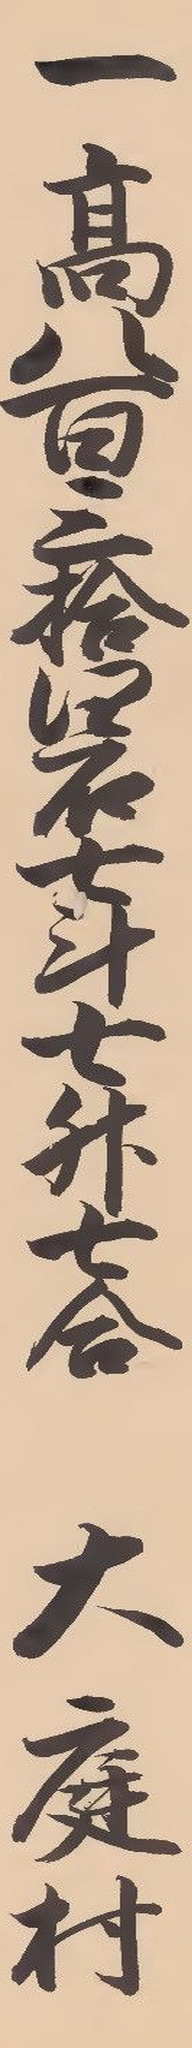一高八百三拾四石七斗七升七合大庭村
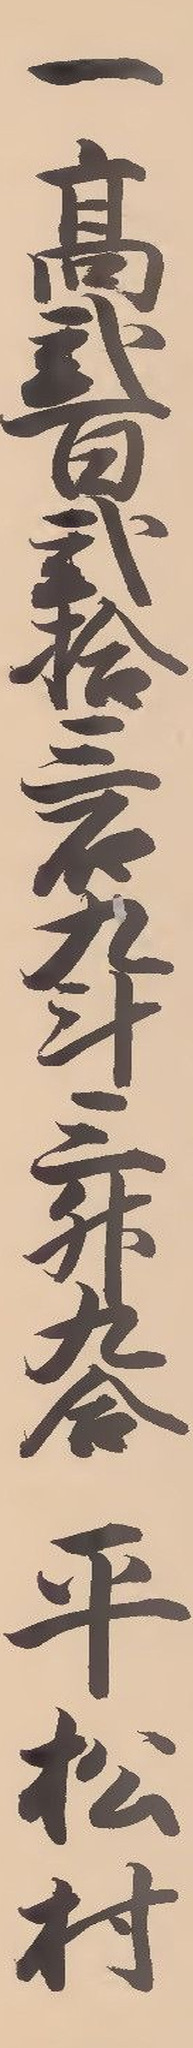一高弐百弐拾三石九斗三升九合平松村
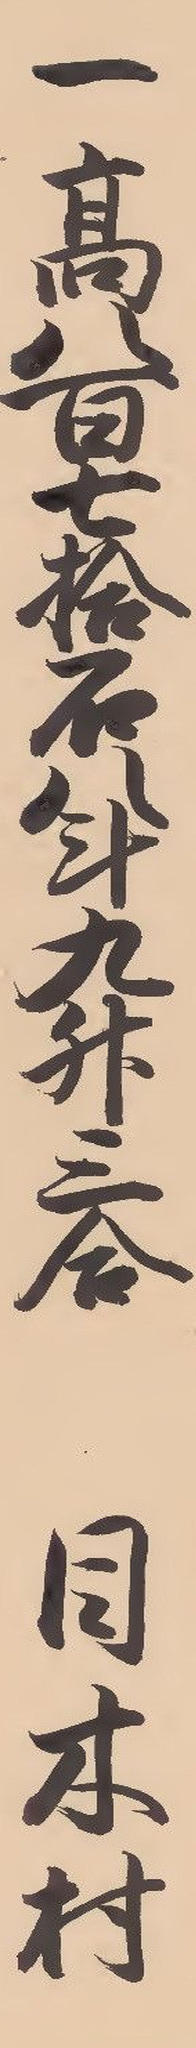一高八百七拾石八斗九升三合目木村
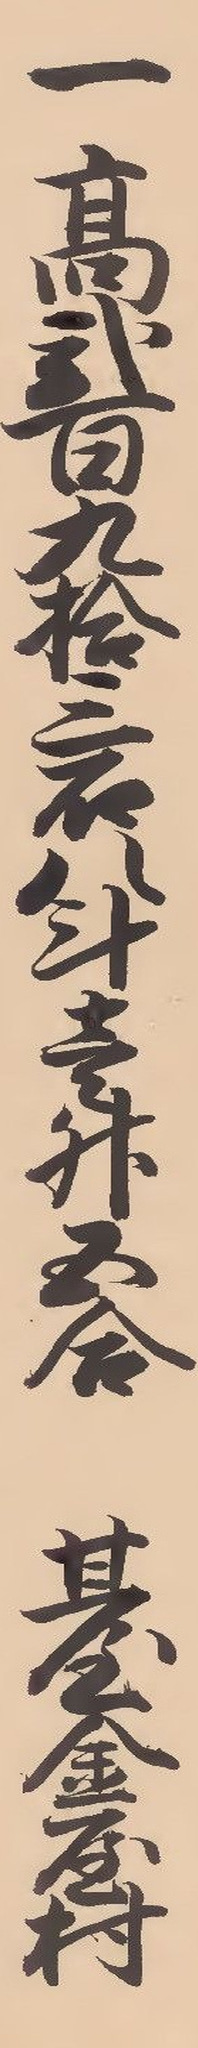一高弐百九拾三石八斗壱升五合台金屋村
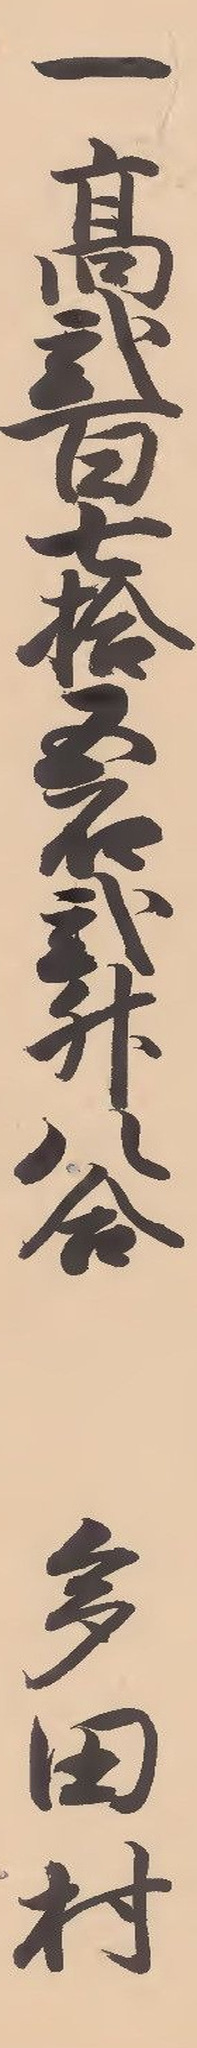一高弐百七拾五石弐升八合多田村

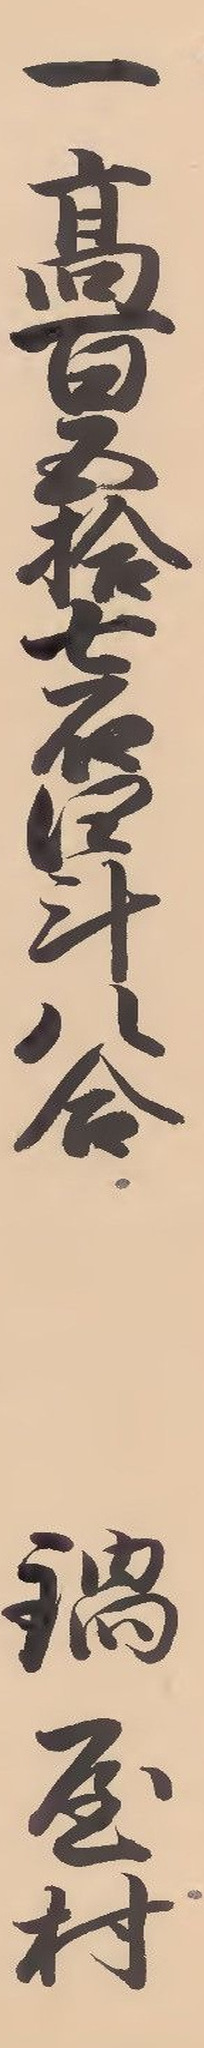一高百五拾七石四斗八合鍋屋村
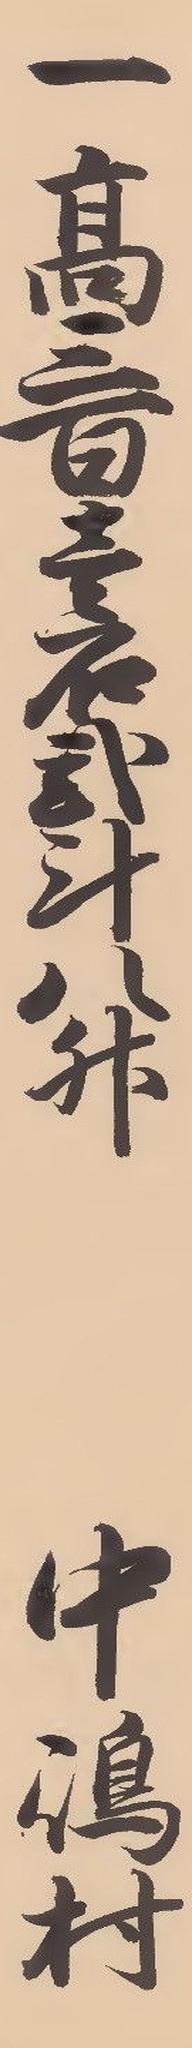一高三百壱石弐斗八升中島村
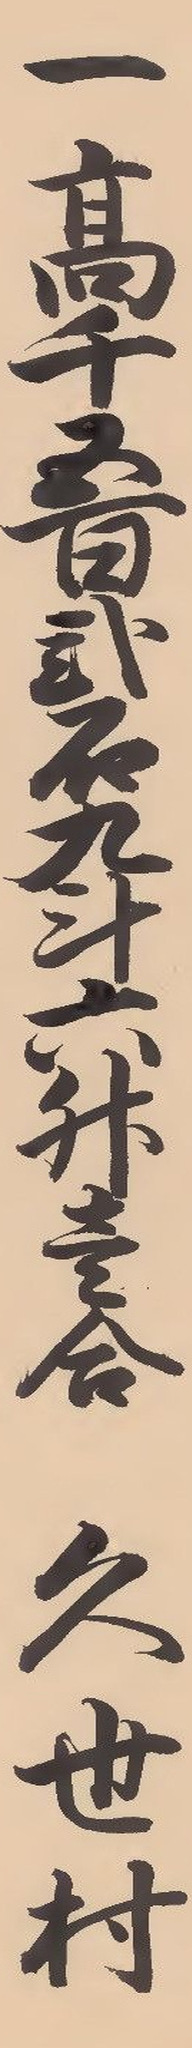一高千五百弐石九斗六升壱合久世村
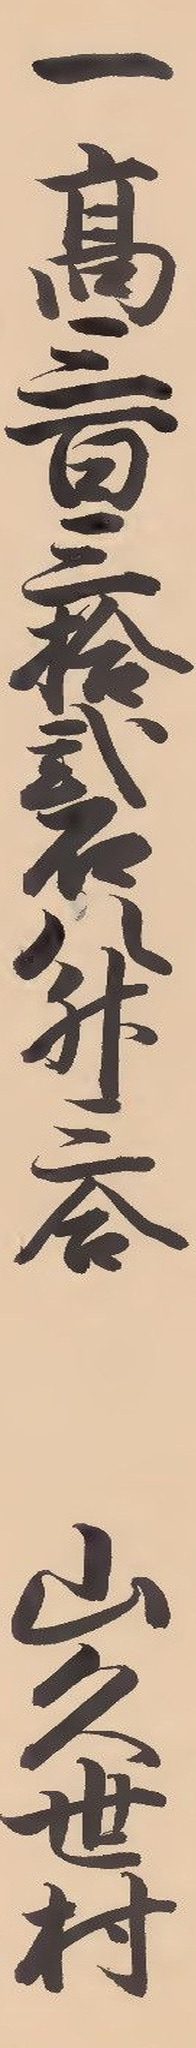一高三百三拾弐石八升三合山久世村
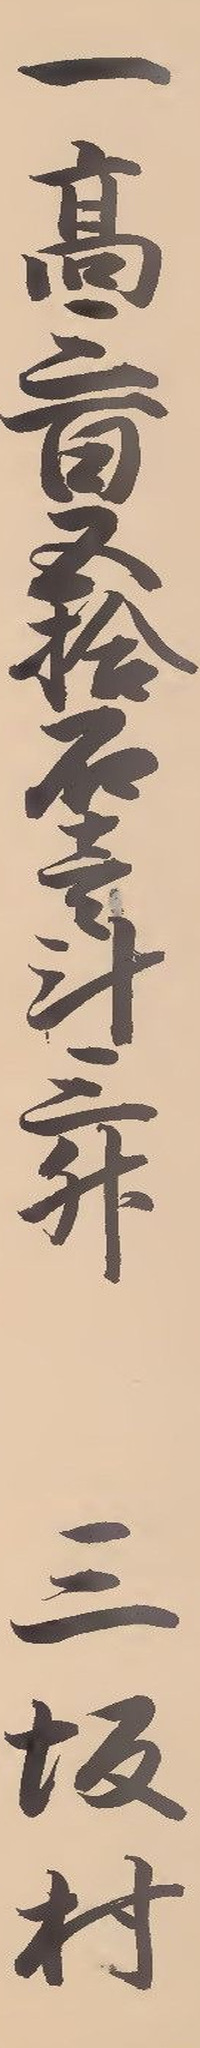一高三百五拾石壱斗三升三坂村
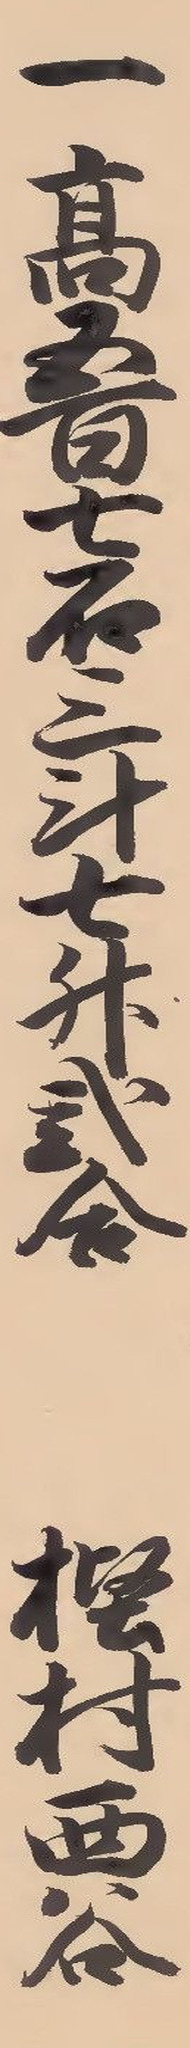一高五百七石三斗七升弐合樫村西谷
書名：美作国郷帳
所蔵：国立公文書館 National Archives of Japan
